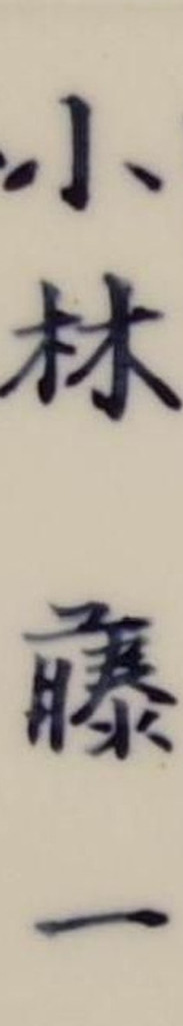小林藤一
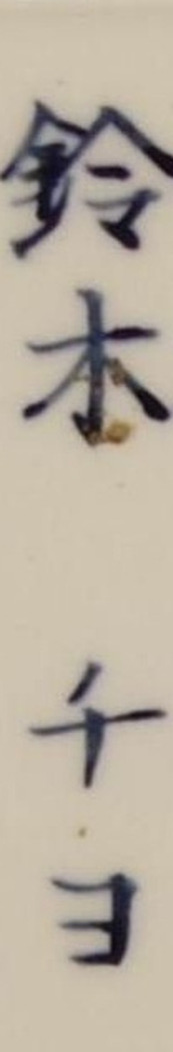鈴木チヨ
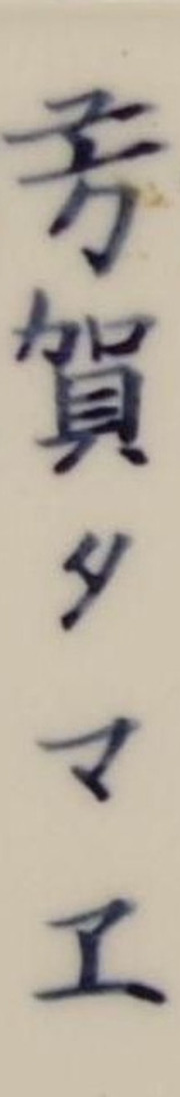芳賀タマエ
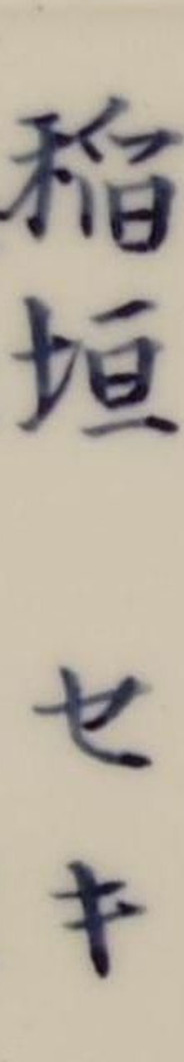稲垣セキ
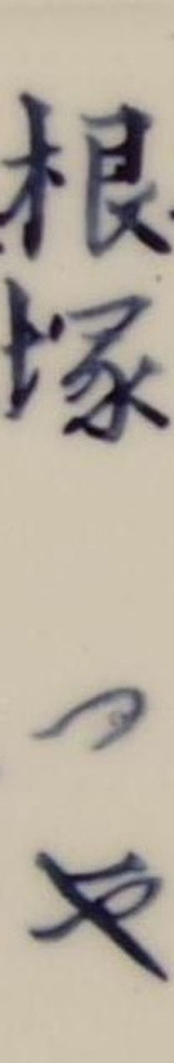根塚つや
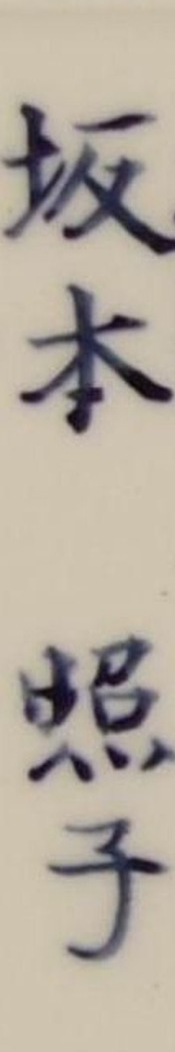坂本照子
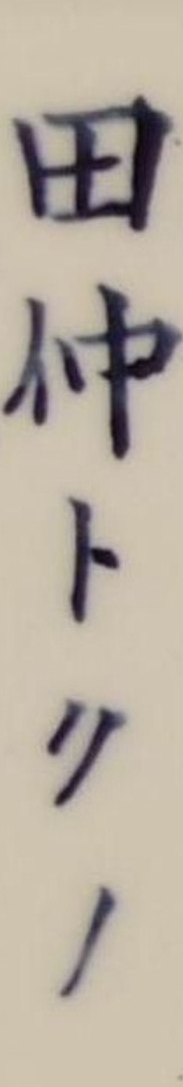田仲トクノ
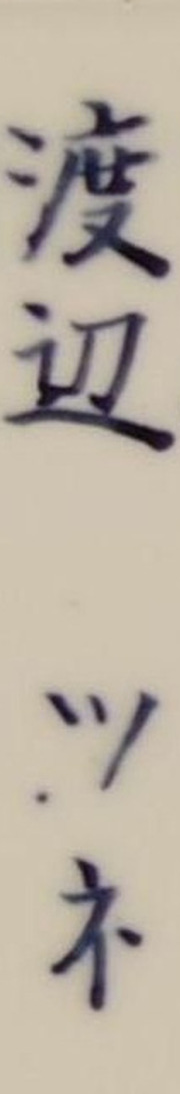渡辺ツネ
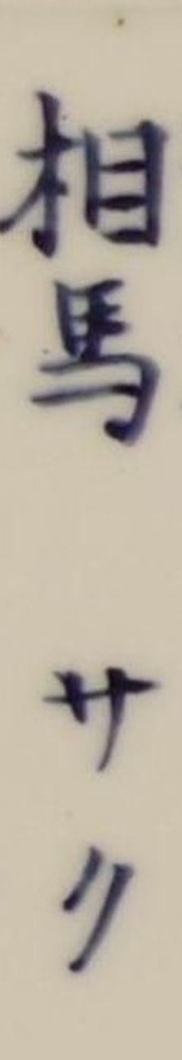相馬サク
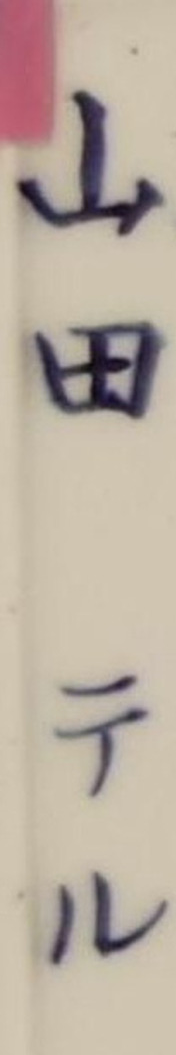山田テル

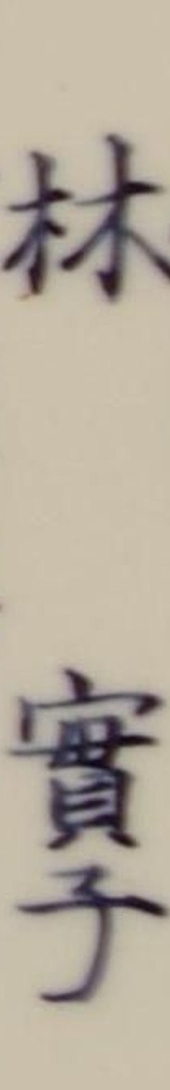林寶子
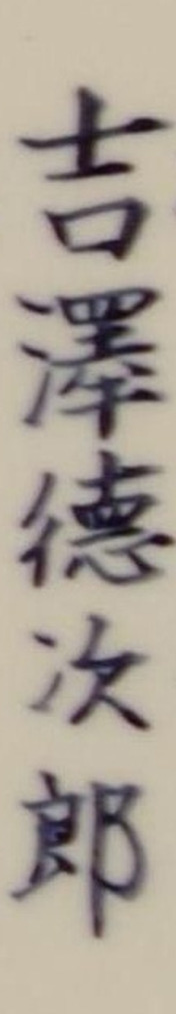吉澤徳次郎
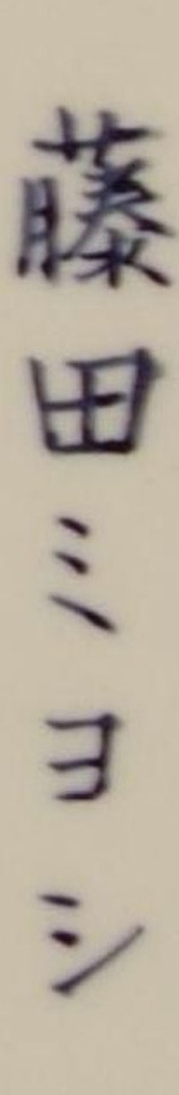藤田ミヨシ
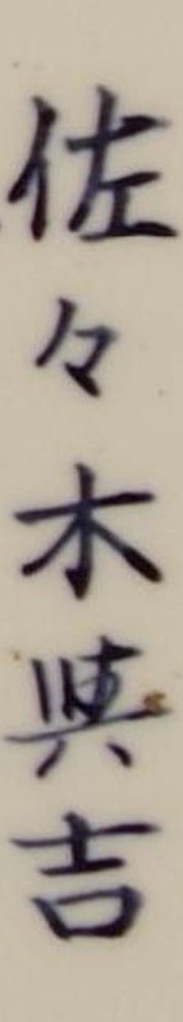佐々木与吉
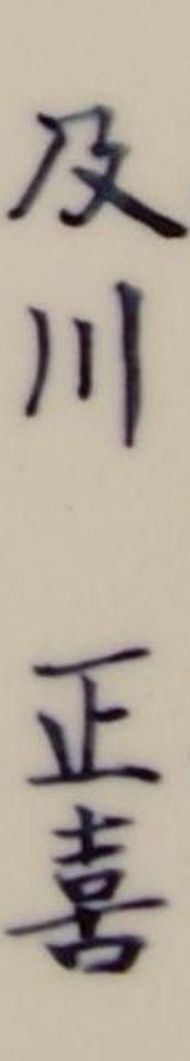及川正喜
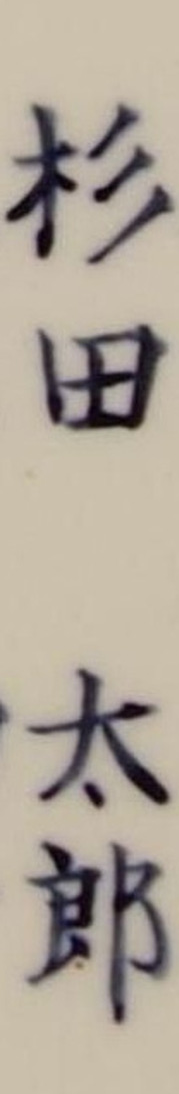杉田太郎
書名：M~S
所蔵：高野山金剛峯寺
